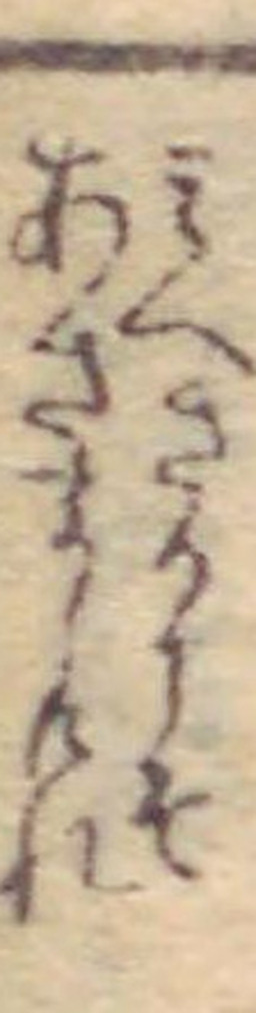あさましけれ

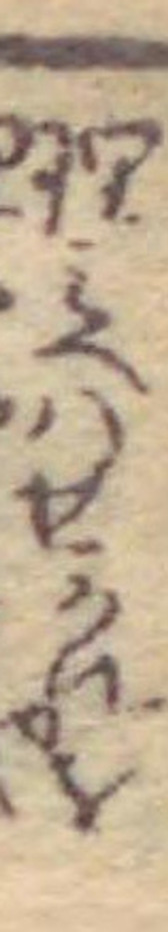理兵へはせかれを
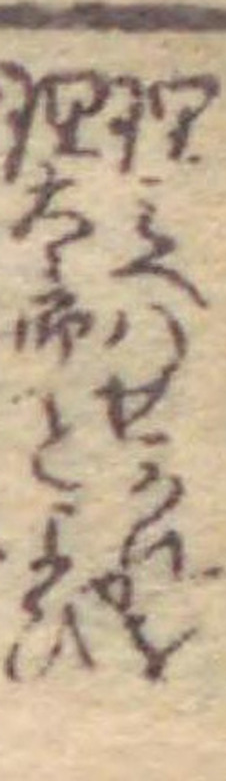理太郎とよび
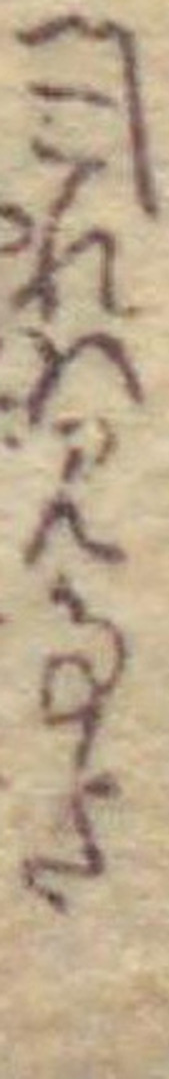〽これは見事だ
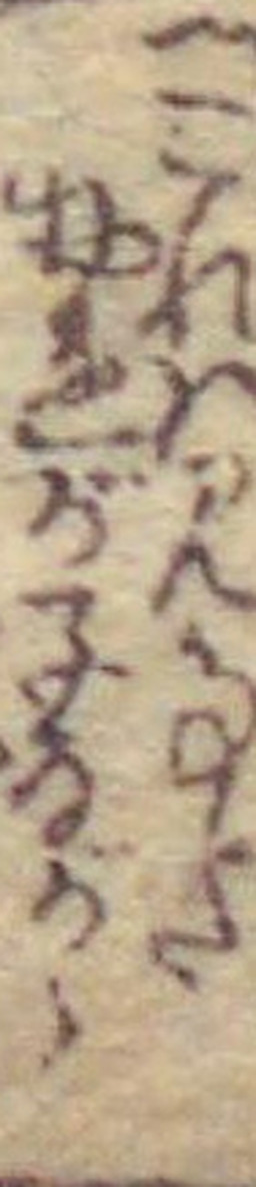おれが子ながら
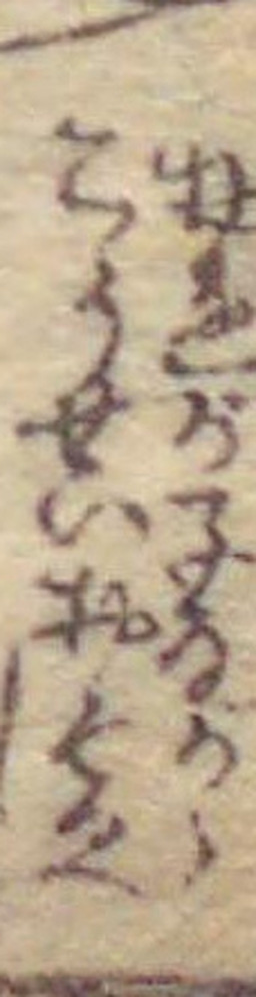こうせいおそるへ
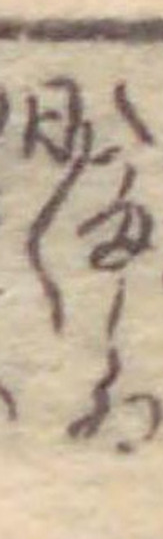たましゐ
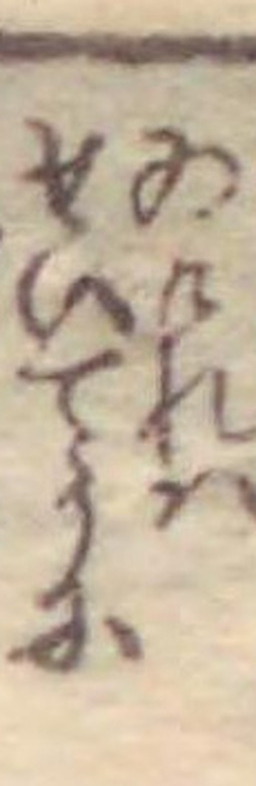せいてうに
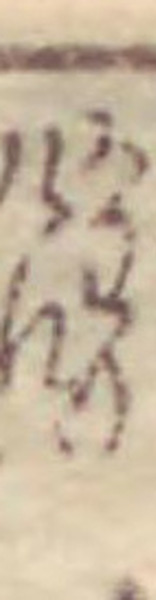けれは
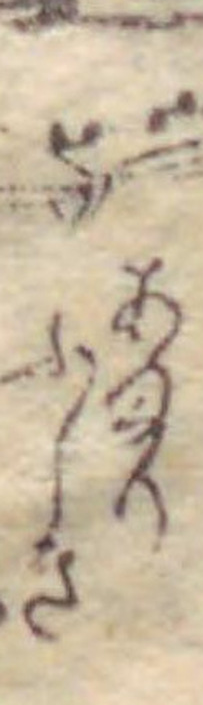ふしき
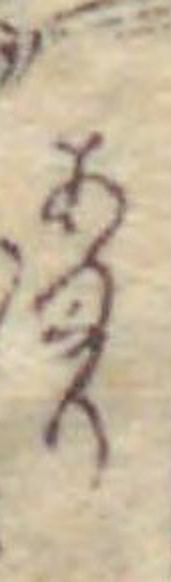あまり
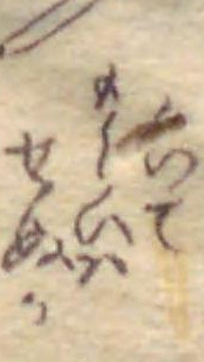せぬか
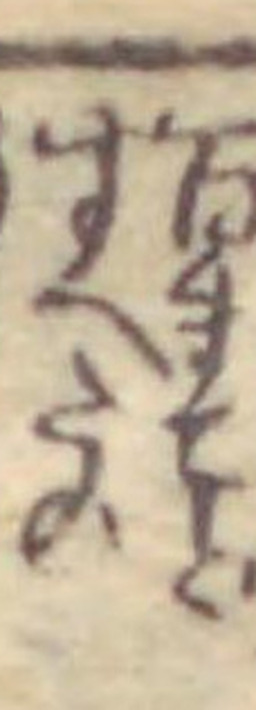すへたの
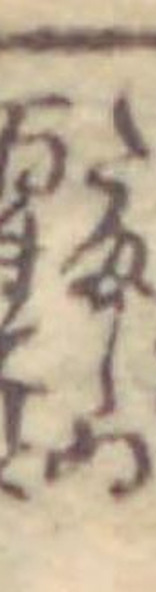たましゐ
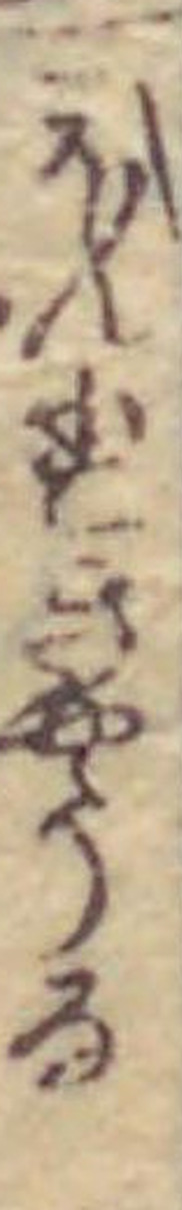〽ほんにこきやうな
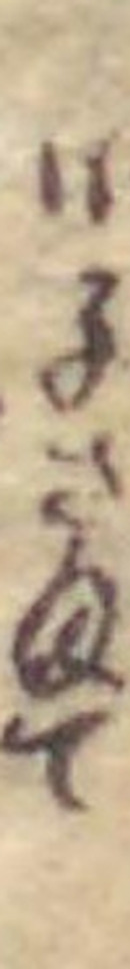お子さまて
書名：心学早染艸 : 3巻
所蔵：国立国会図書館 National Diet Library, JAPAN
